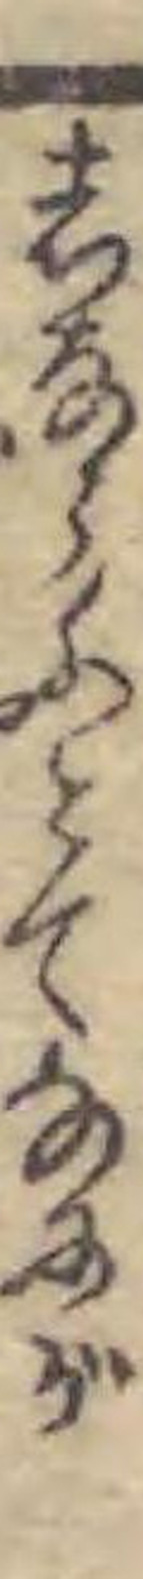しならうとてなにが
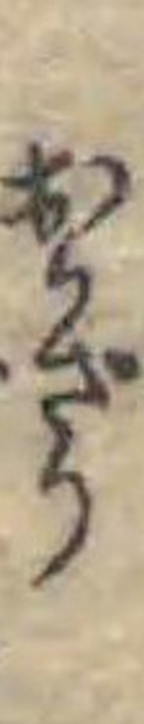おかざり
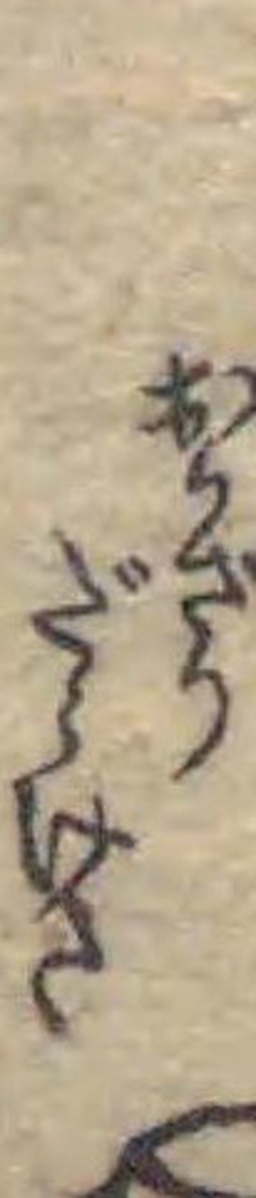だらけた
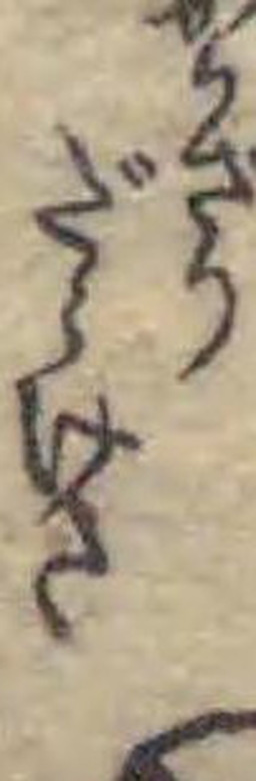だらけた
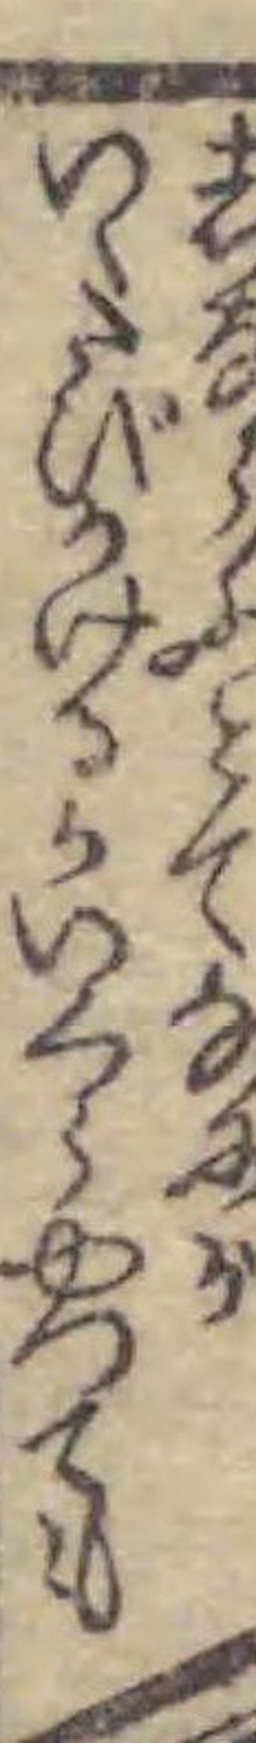いくたびかけるかいくらやつても
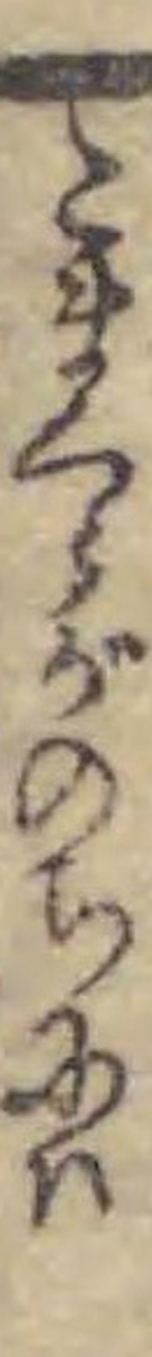こまくがのちには
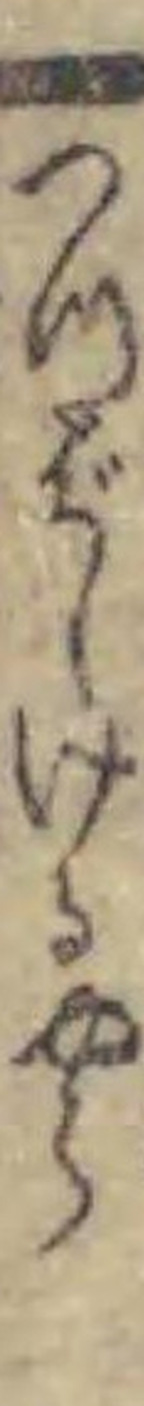つつばしけるやら
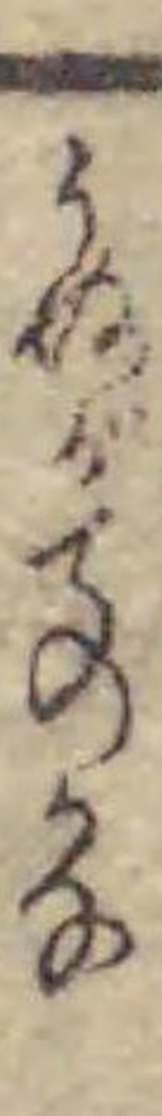うぬがてのかな
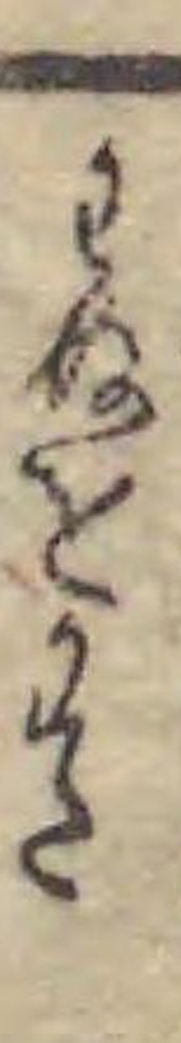わぬをわた
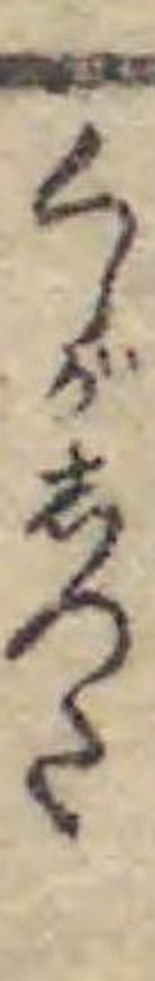くしがしつた
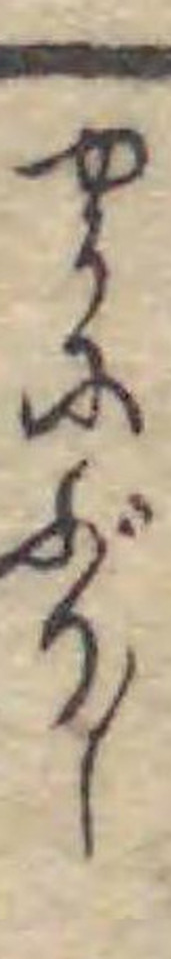やうにぶり〳〵
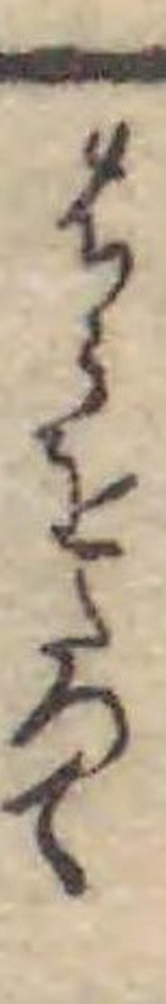はらをたつて
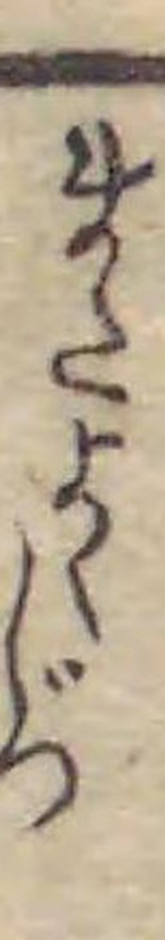またよくじつ
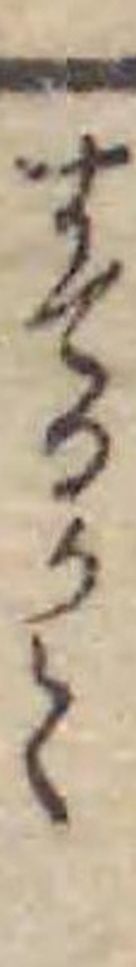すてるかと
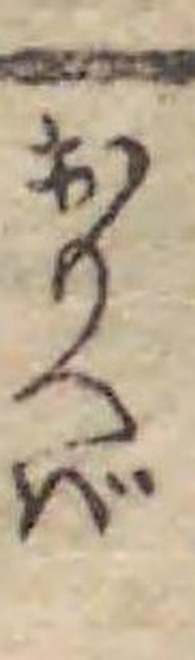おもへば
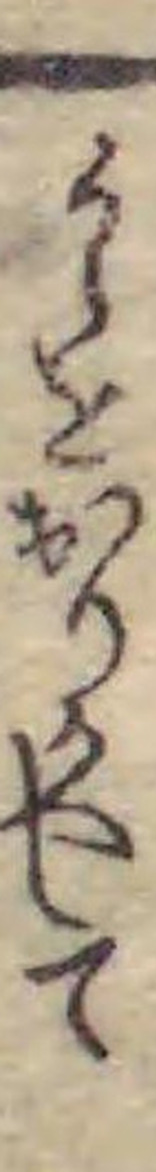うらをおりかへして
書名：紙屑身上噺 : 3巻
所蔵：国立国会図書館 National Diet Library, JAPAN
